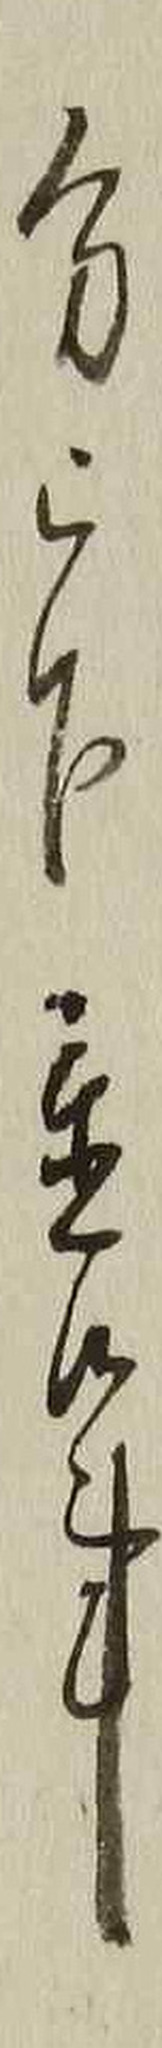分被下置候事
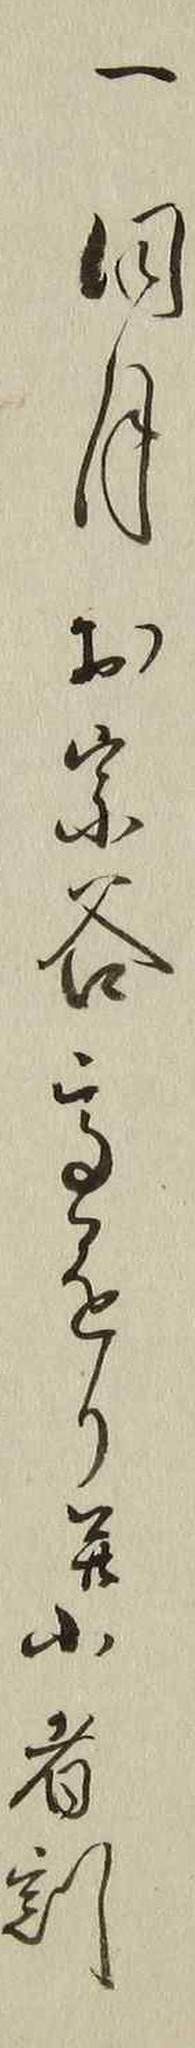一同月於宗谷高懸り并小者割
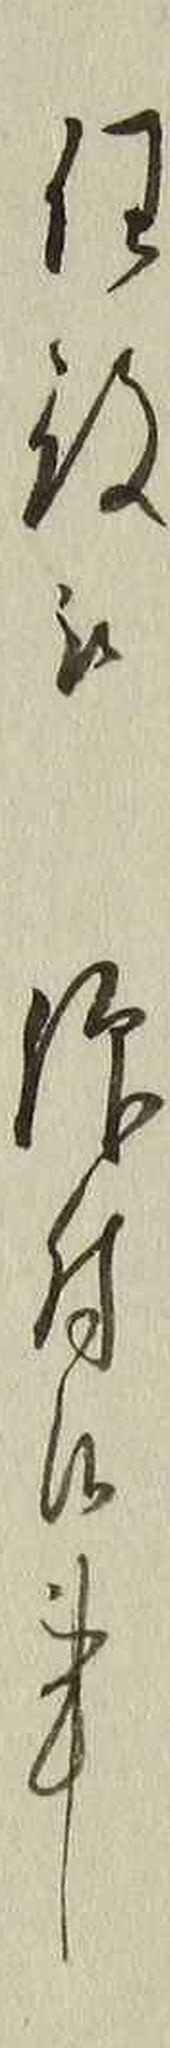任役被仰付候事
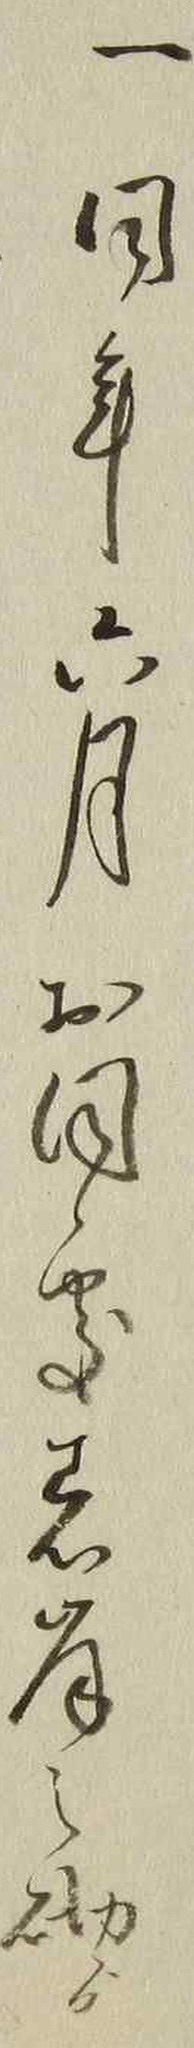一同年六月於同処着岸之砌ゟ
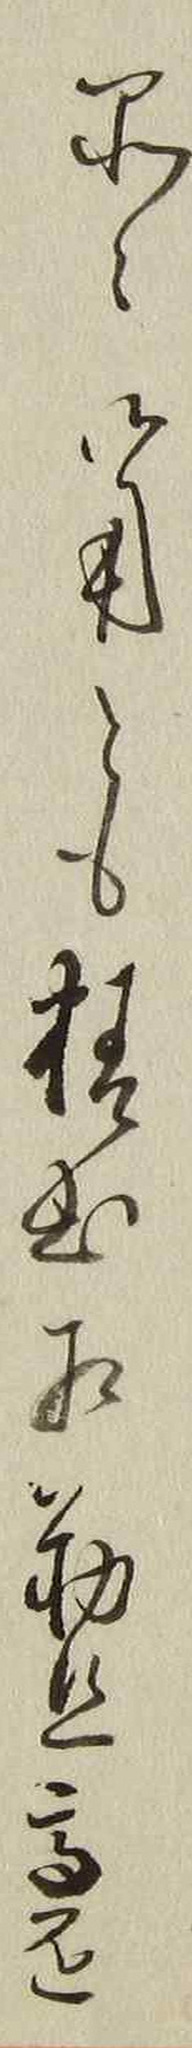早々御用とも精出相勤且高懸
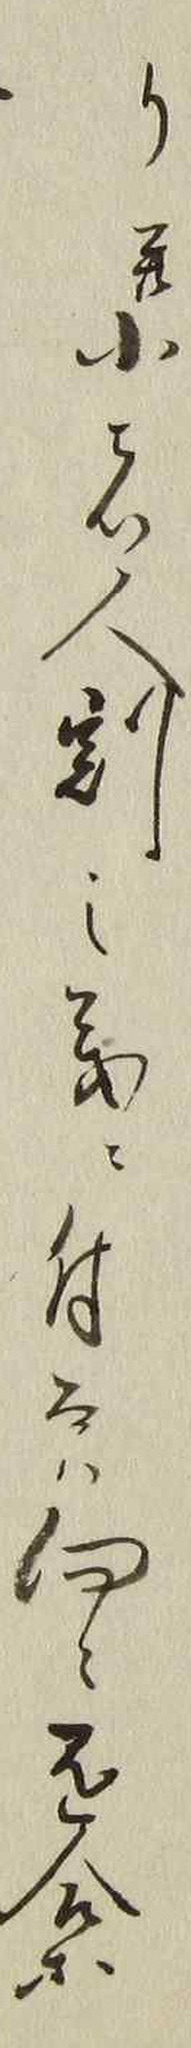り并小者人割之義ニ付而ハ向々懸合等
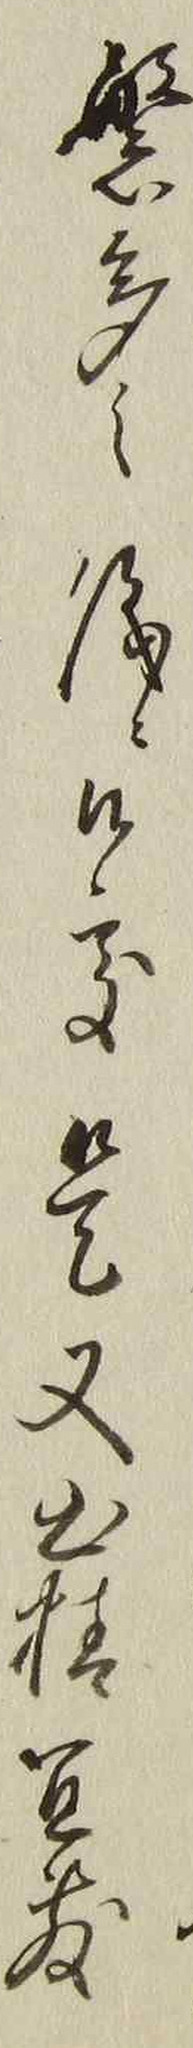繁多之儀ニ候処是又出精宜敷
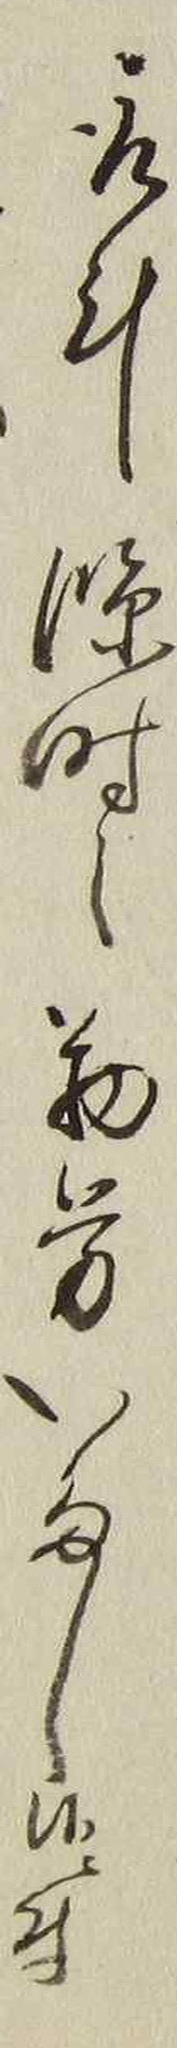取計臨時之勤労いたし候ニ付
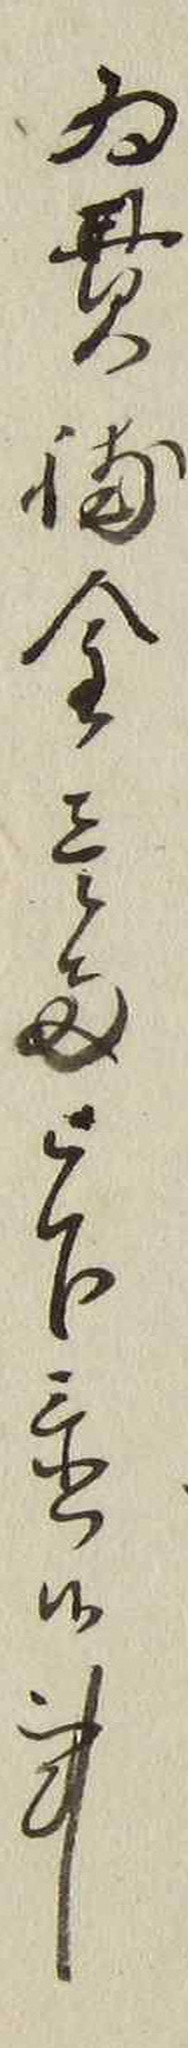為費補金壱両被下置候事
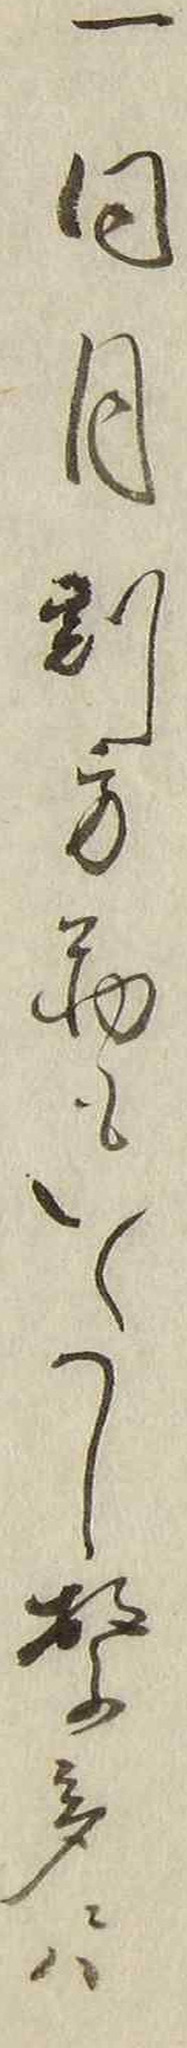一同月割方勤もいたし繁多ニハ
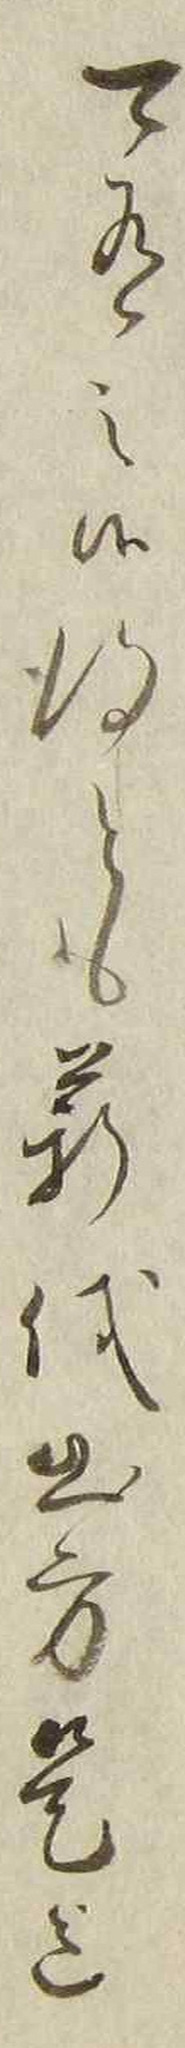可有之候得とも薪伐出方是迄

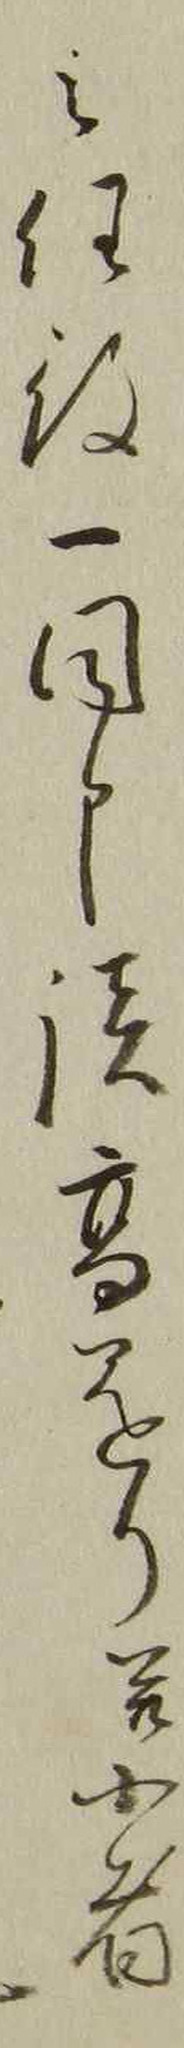之任役一同申談高懸り并小者
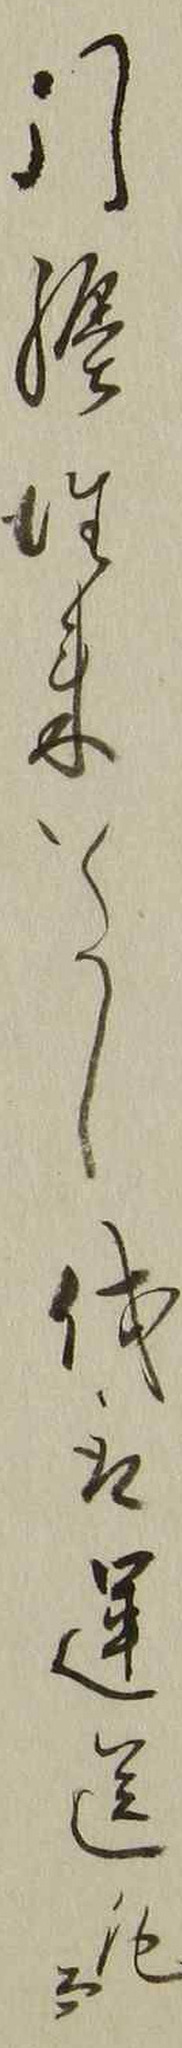引纏往来いたし伐取運送凡而
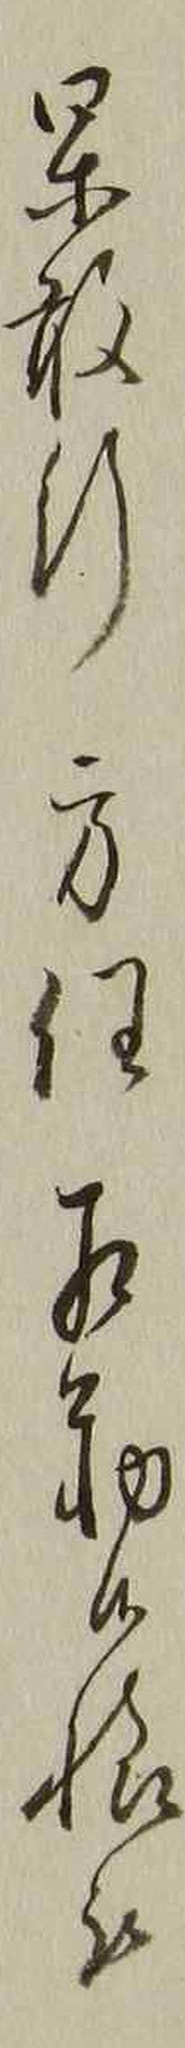果敢行方任相勤候様被
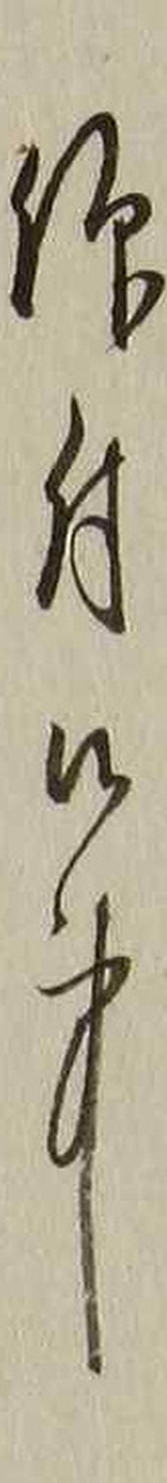仰付候事
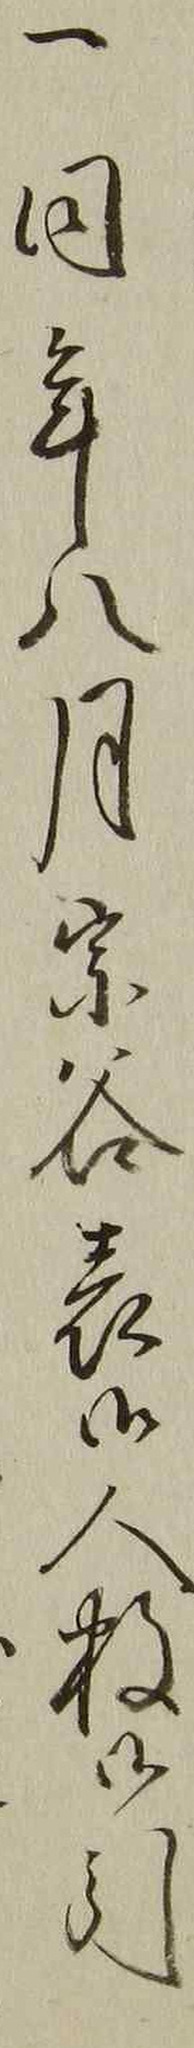一同年八月宗谷表御人数御引
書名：諸士系譜　巻之132　た之部8
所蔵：会津若松市立会津図書館
